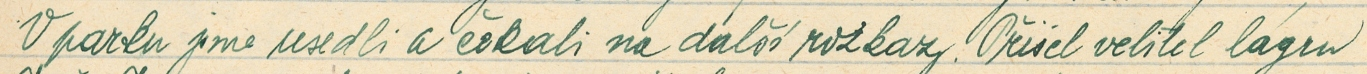V parku jsme usedli a čekali na další rozkazy. Přišel velitel lágru
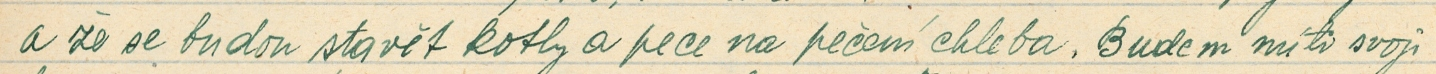a že se budou stavět kotly a pece na pečení chleba. Budem míti svoji
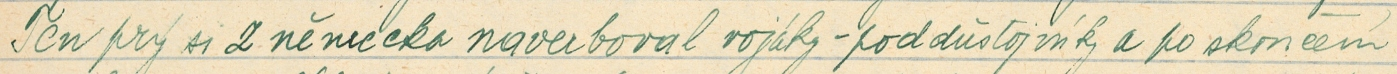Ten prý si z německa naverboval vojáky - poddůstojníky a po skončení
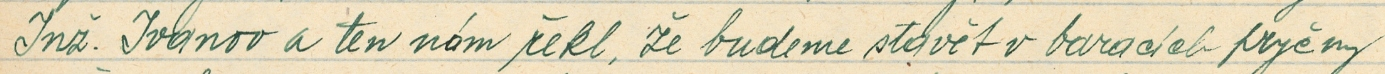Inž. Ivanov a ten nám řekl, že budeme stavět v baracích pryčny
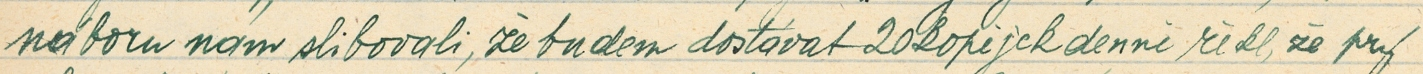náboru nám slibovali, že budem dostávat 20 kopějek denně řekl, že prý
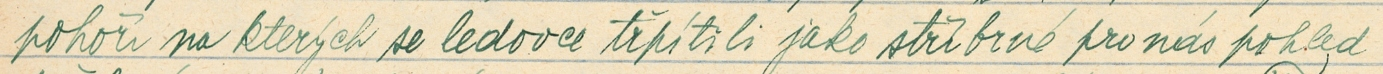pohoří na kterých se ledovce třpítili jako stříbrné pro nás pohled
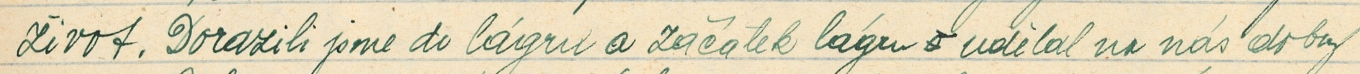život. Dorazili jsme do lágru a začátek lágru udělal na nás dobrý
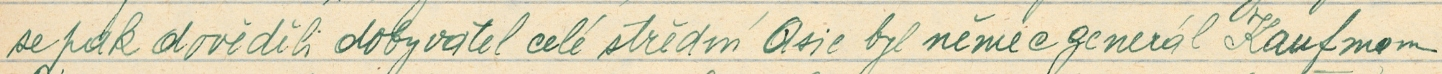se pak dověděli dobyvatel celé střední Asie byl němec generál Kaufmann
